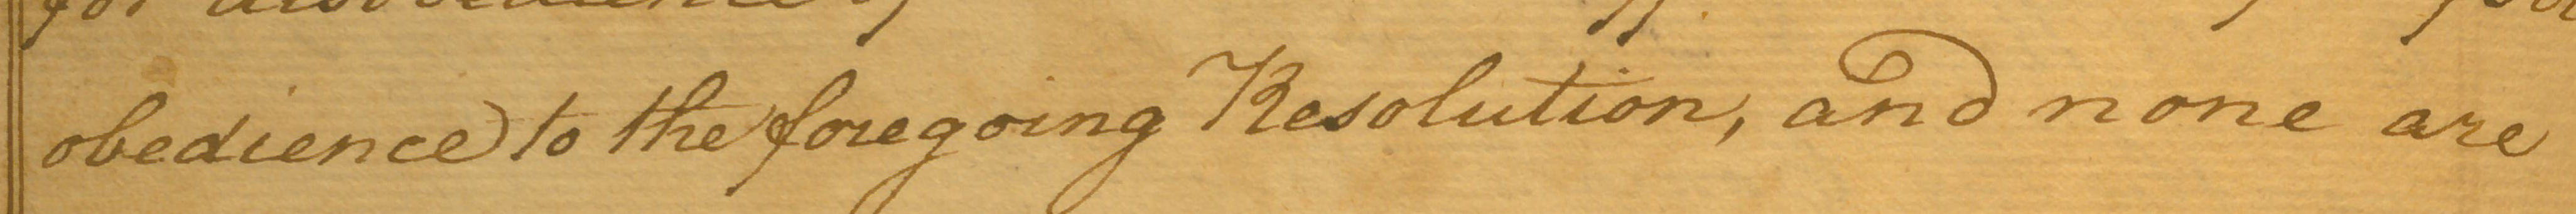obedience to the foregoing Resolution, and none are
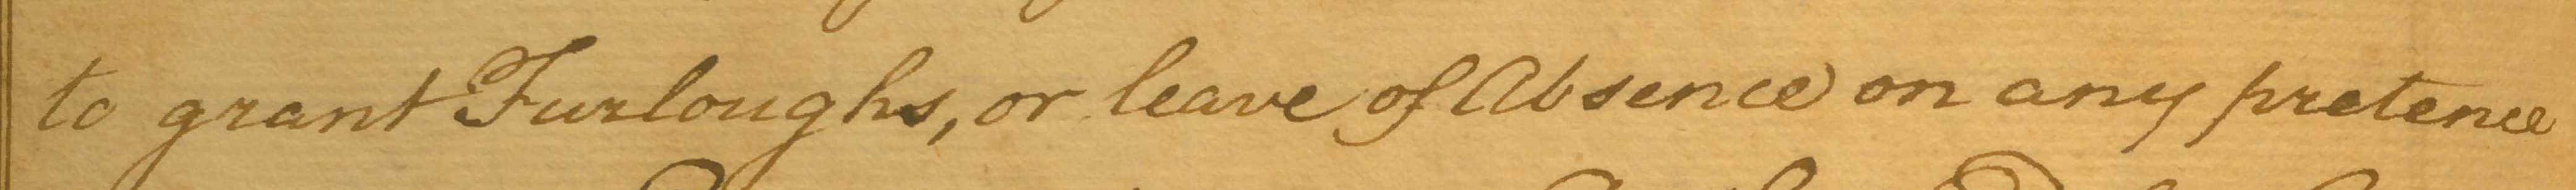to grant Furloughs, or leave of Absence on any pretence
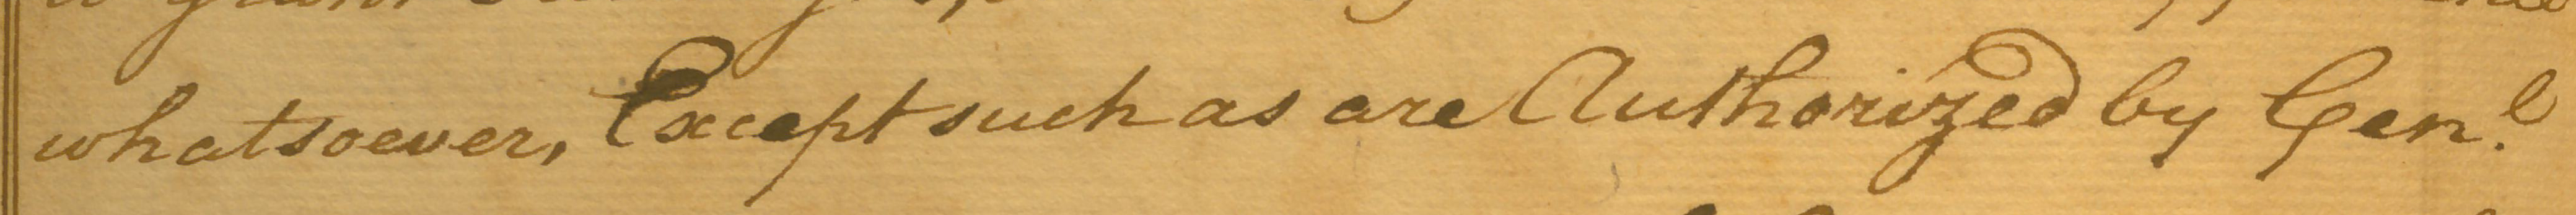whatsoever, Except such as are Authorized by Gen^l.
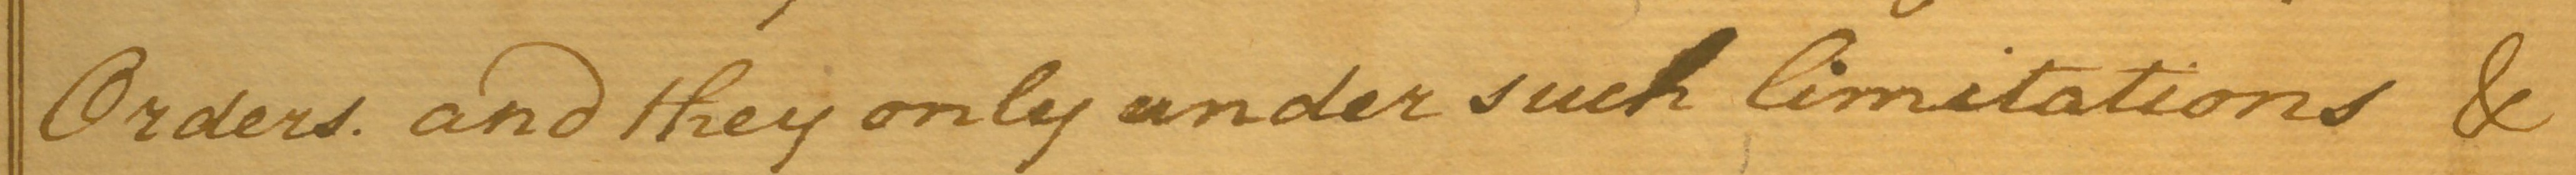Orders. and they only under such limitations &
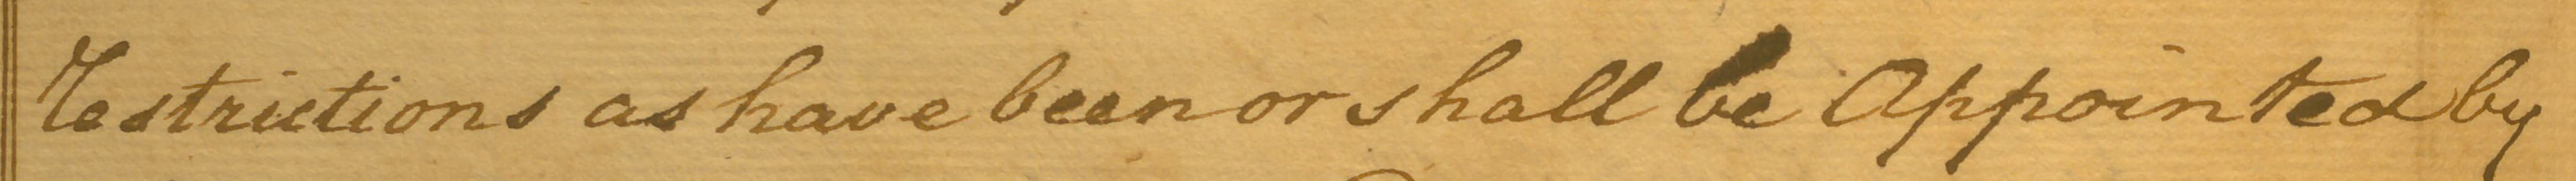restrictions as have been or shall be Appointed by
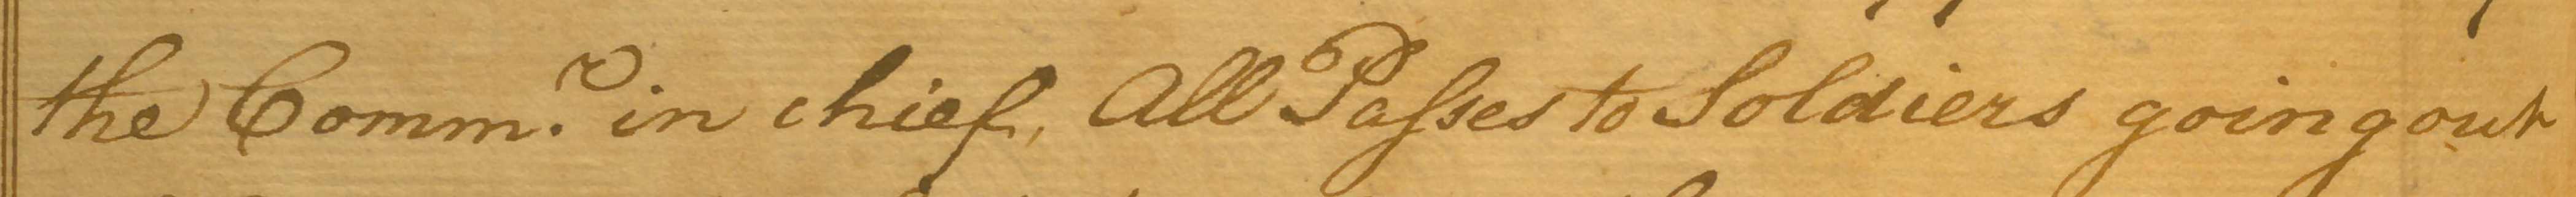the Comm^r. in chief. All Passes to Soldiers going out
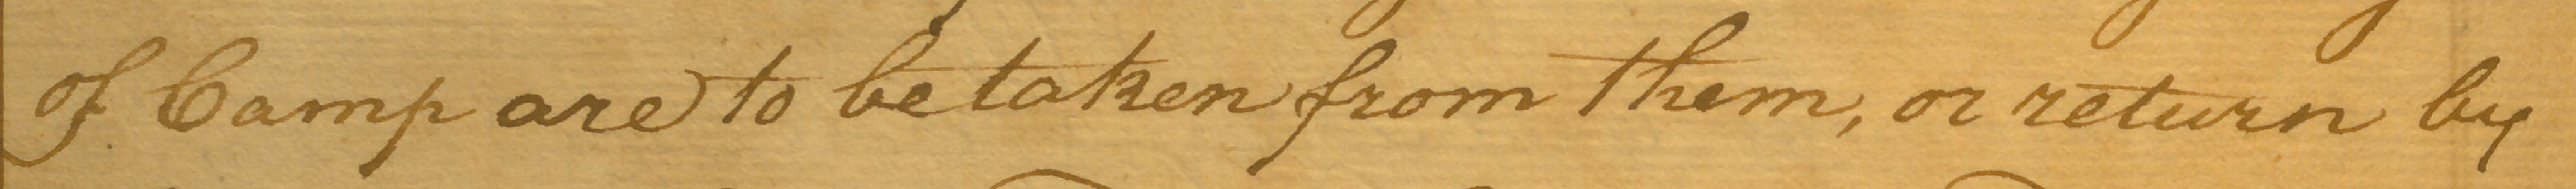of Camp are to be taken from them, or return by
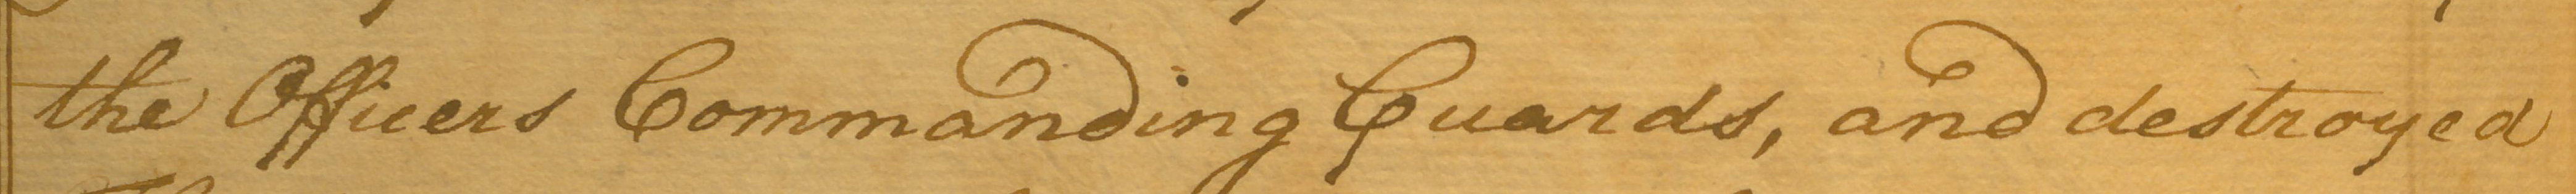the Officers Commanding Guards, and destroyed
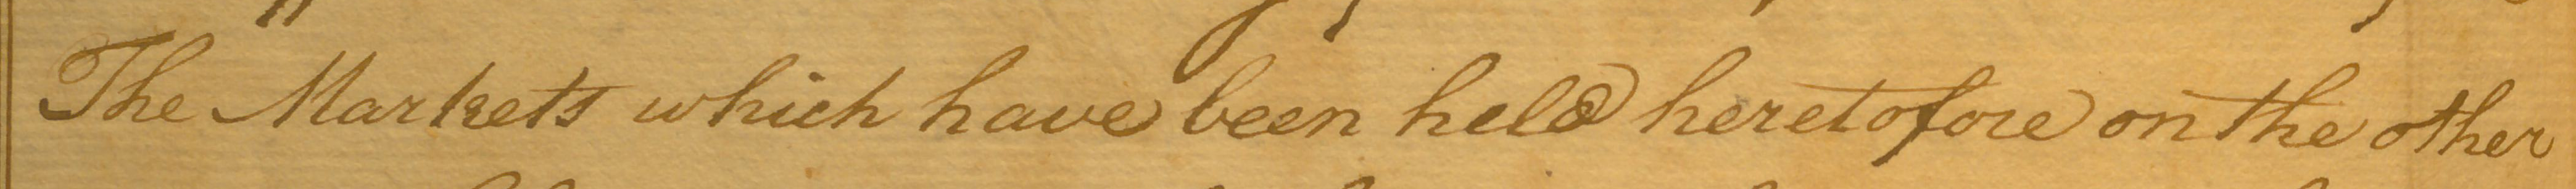The Markets which have been held heretofore on the other
